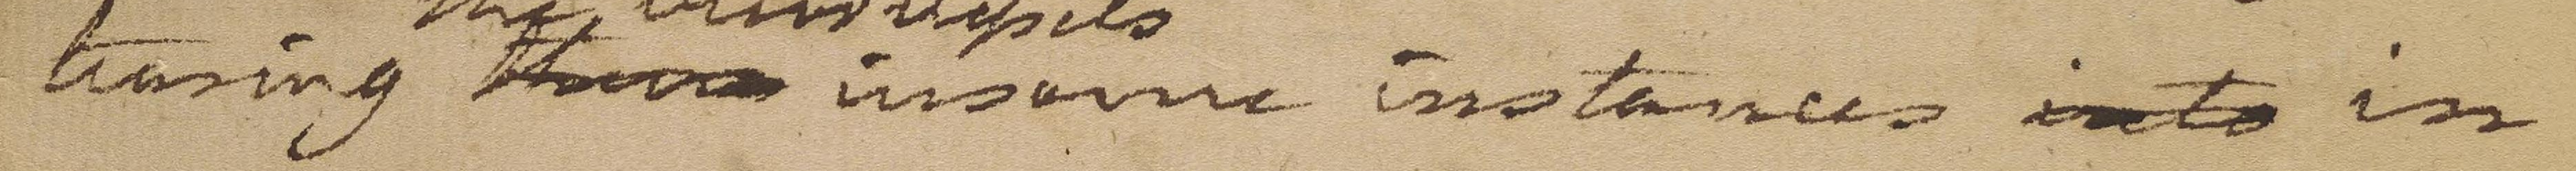tearing [these] in some instances [into] in
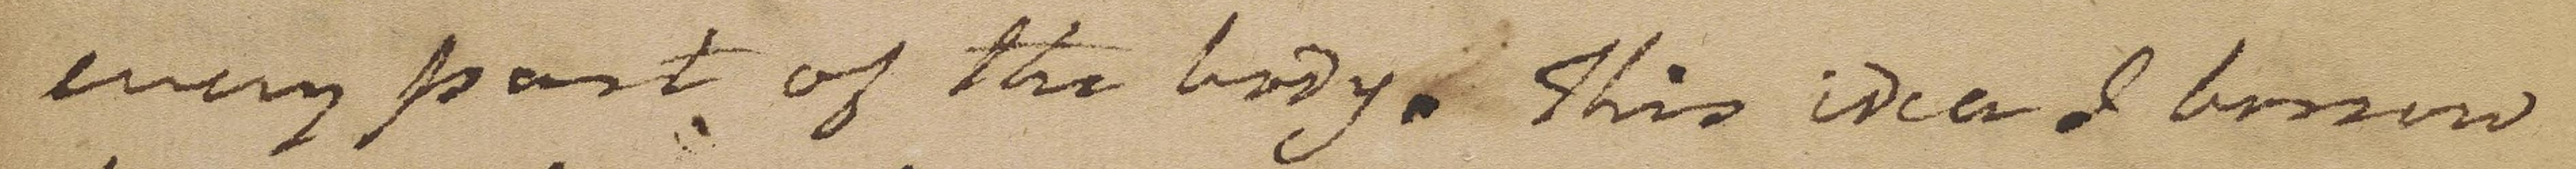ever part of the body. This idea I know
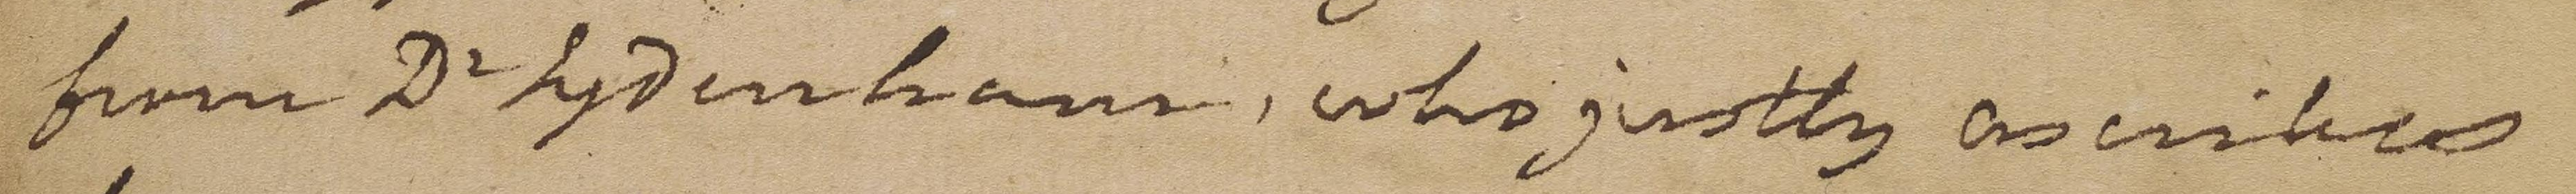from D^r Sydenham, who justly ascribes
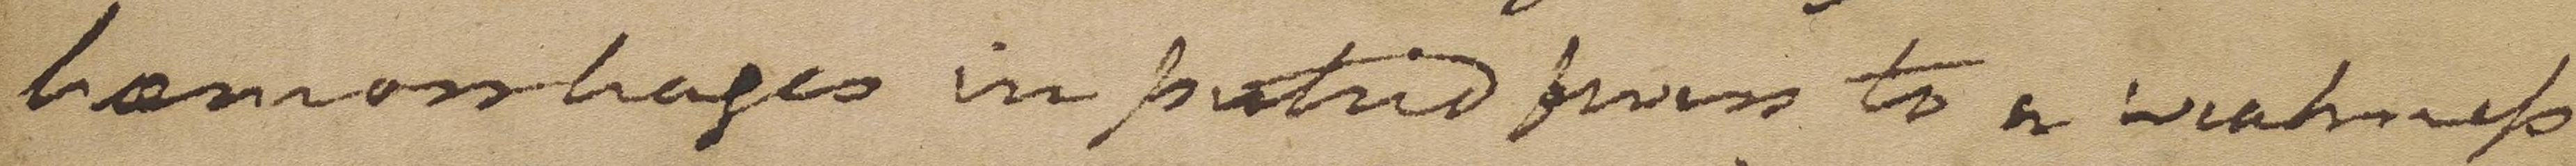hemorrhages in putrid fevers to a weakness
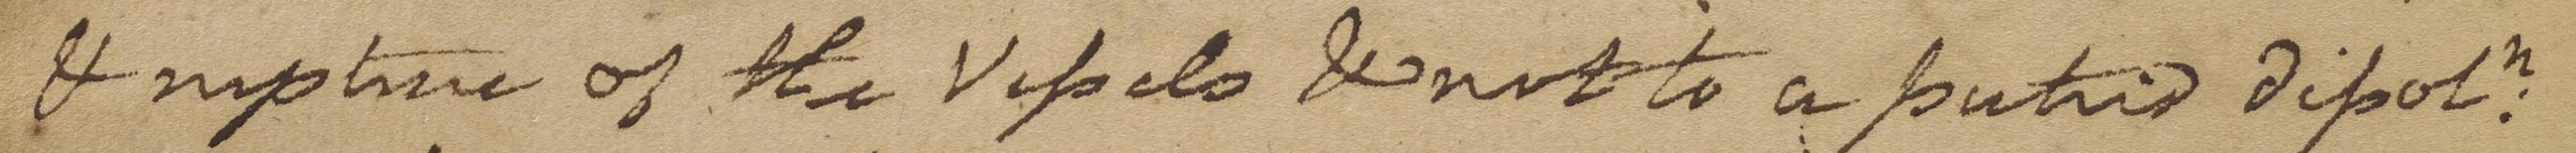& rupture of the vessels & not to a putrid dispos^n
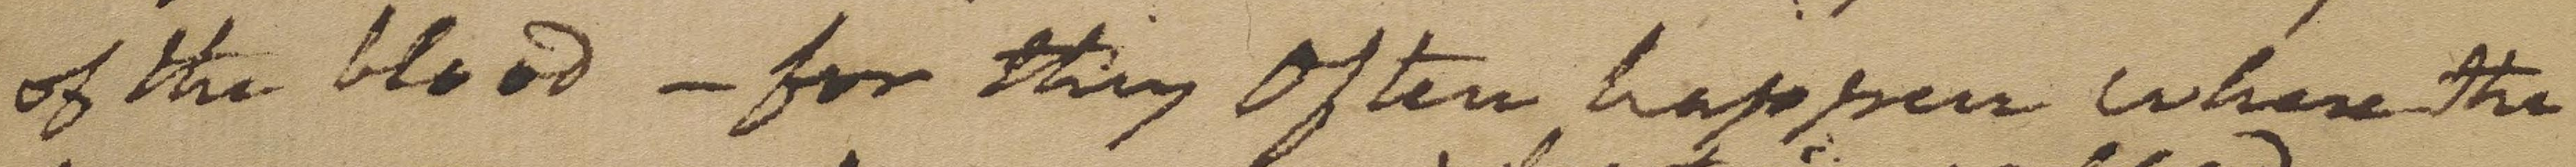of the blood- for they often happen where the
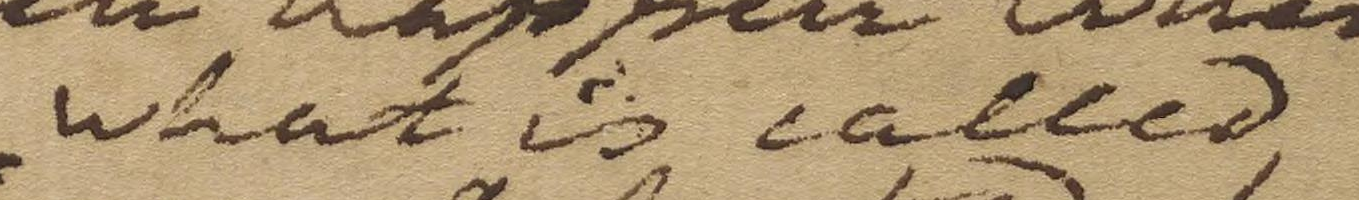What is called
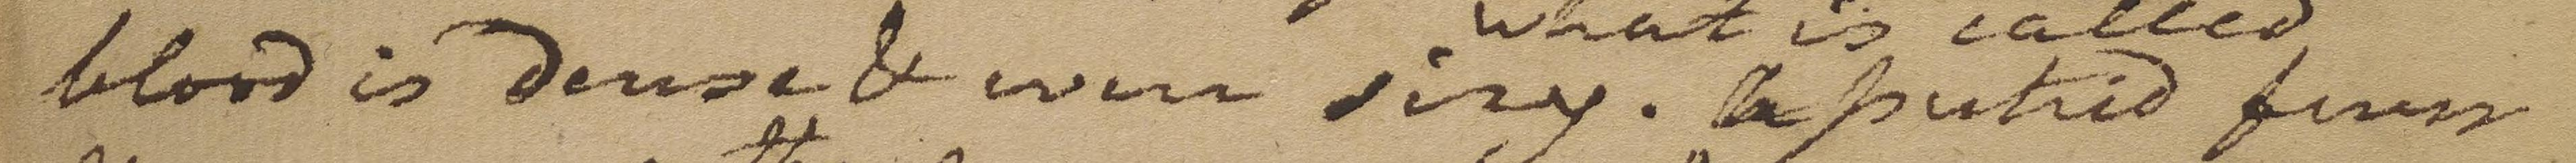blood is dense & even siny. ^ a putrid fever
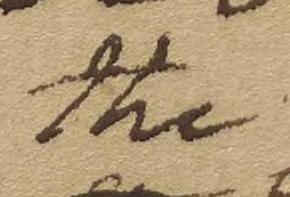the
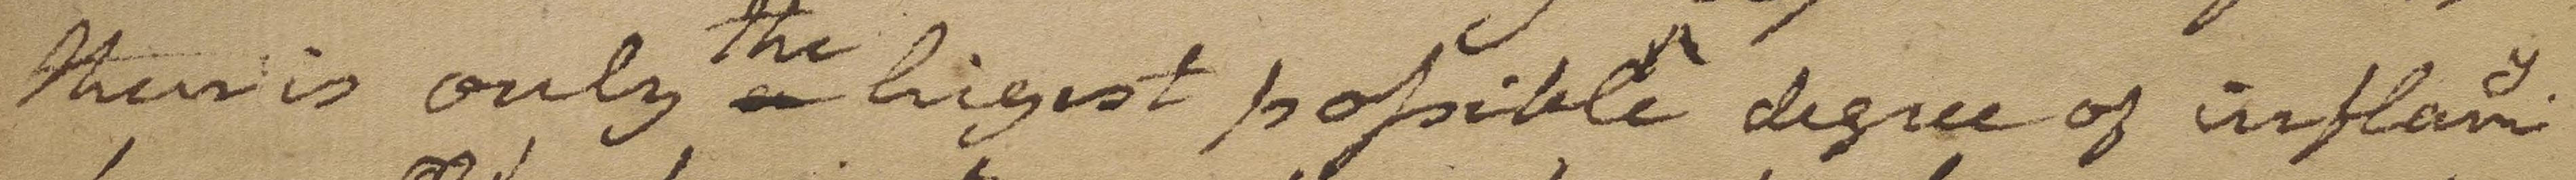there is only [a] highest possible degree of inflam^y
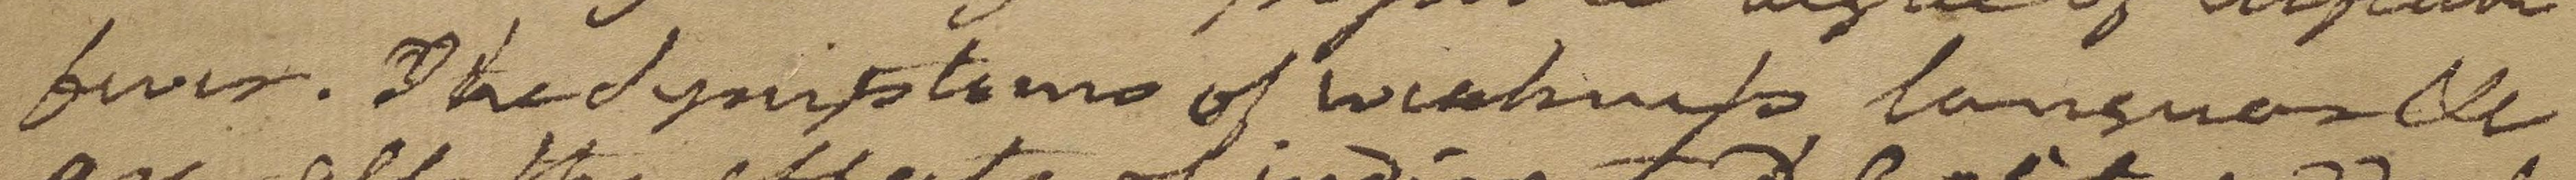fever. The symptoms of weakness, languor &
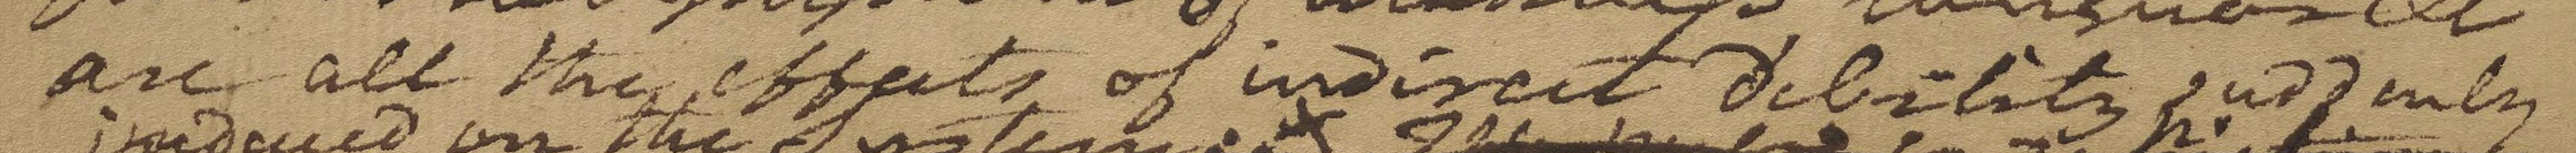are all the effects of indirect debility suddenly
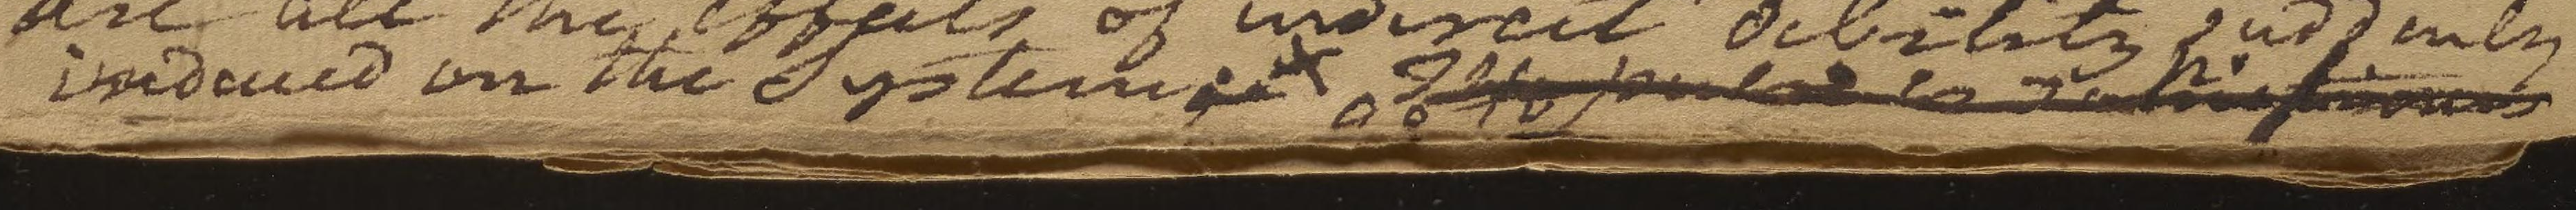induced on the System. [The pulse is _________]
